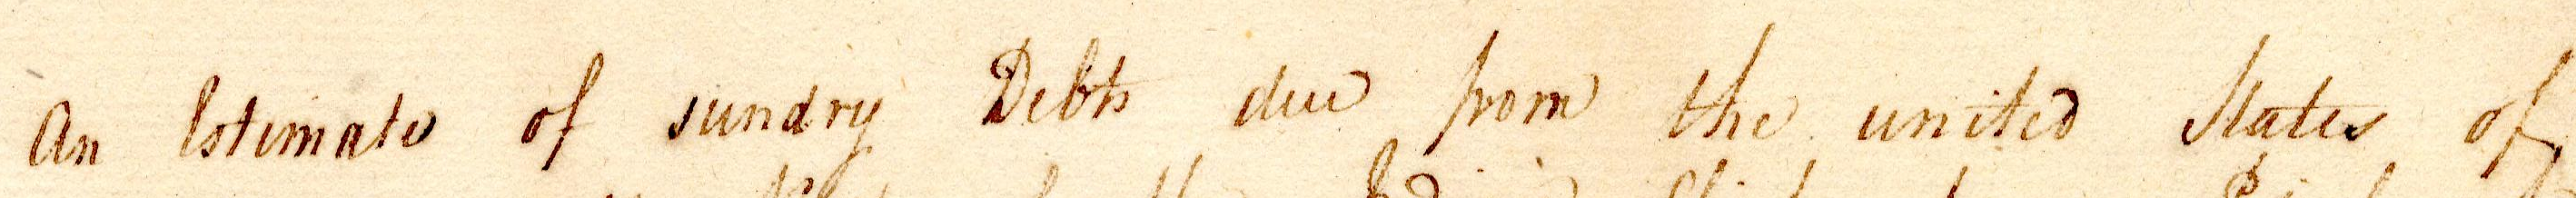An estimate of sundry Debts due from the United States of
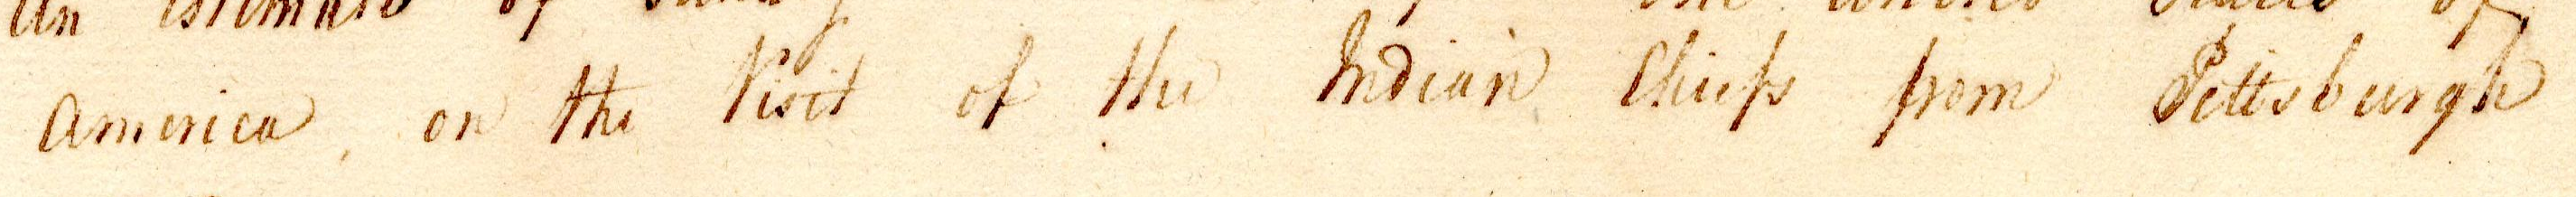America on the Visit of the Indian Chiefs from Pittsburgh
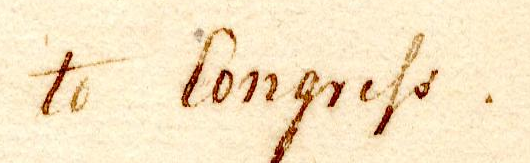to Congress.
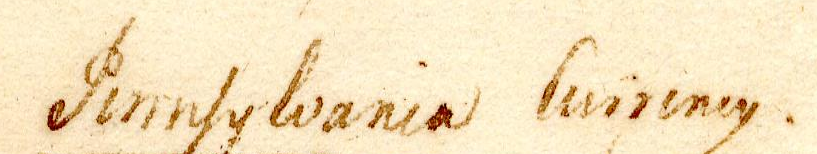Pennsylvania Currency.
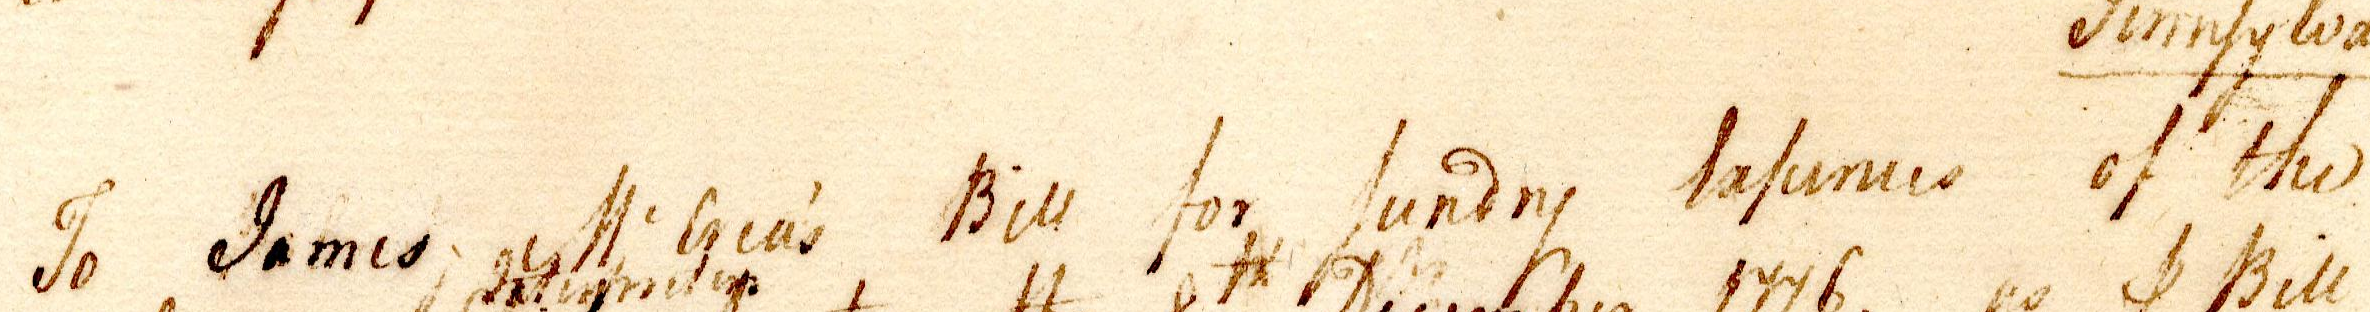To James McGea's Bill for sundry Expenses of the
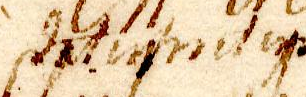Itemized
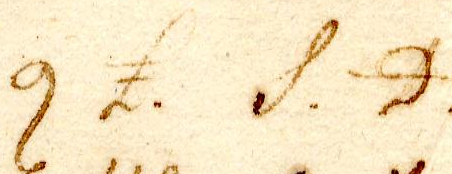£. S. D.
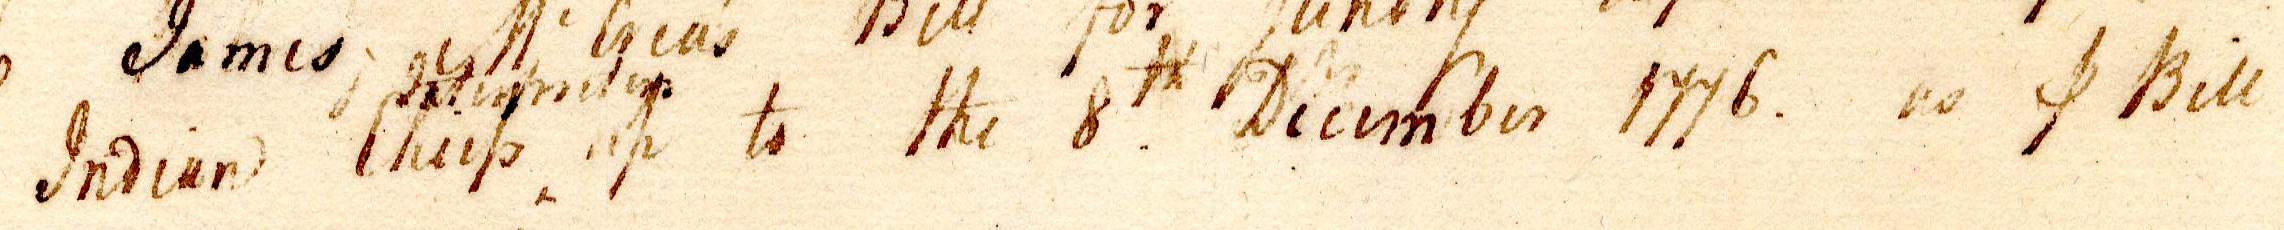Indian Chiefs ^ up to the 8^th December 1776. as Bill
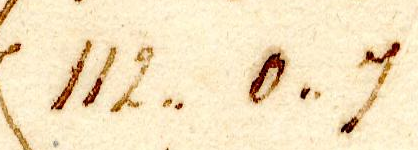112. 0. 7
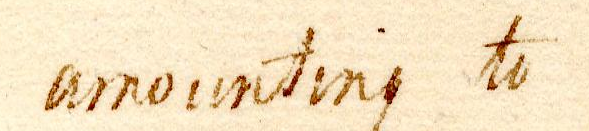amounting to
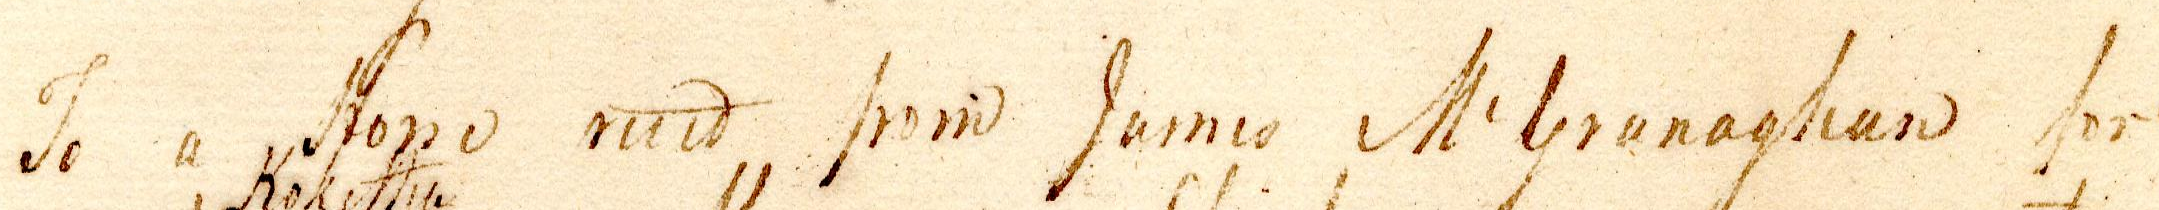To a Horse rented from James McGranaghan for
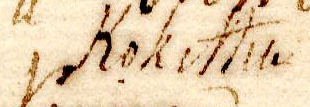Koketha
